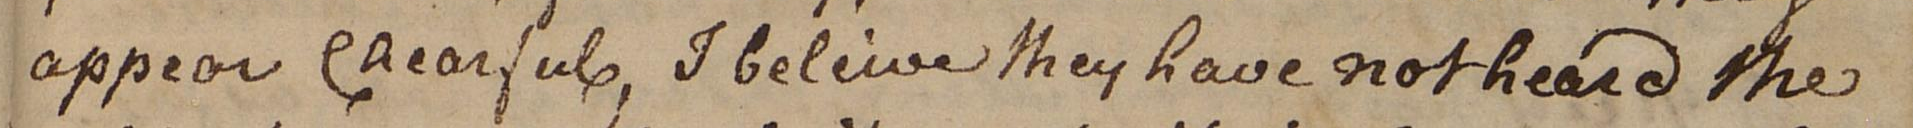appear Chearful, I beleive they have not heard the
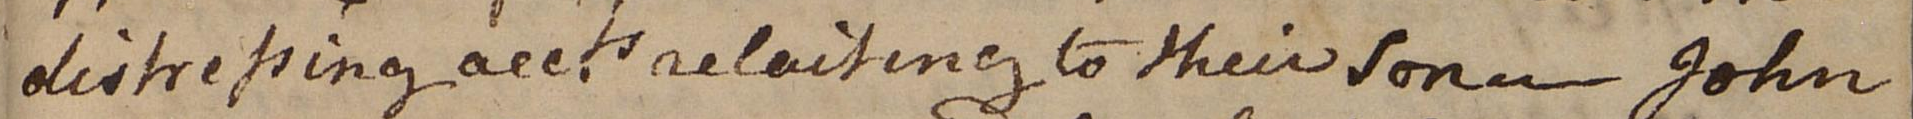distressing acc^ts. relaiting to their Son- John
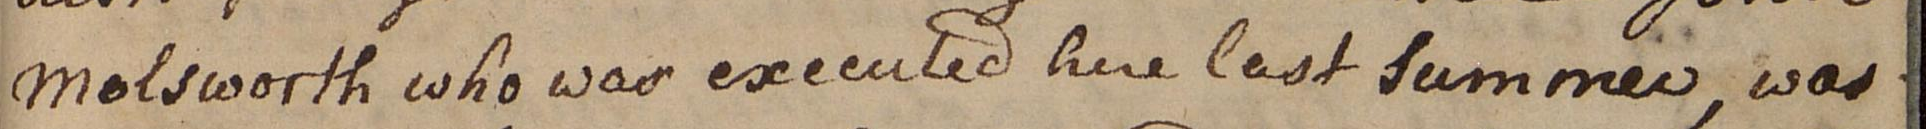Molsworth who was executed here last Summer, was
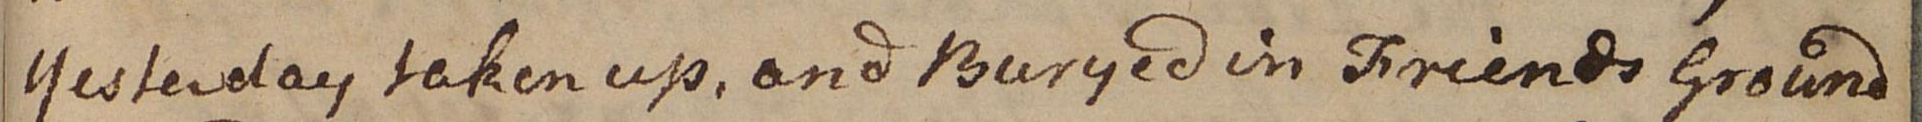Yesterday taken up, and Buryed in Friends Ground
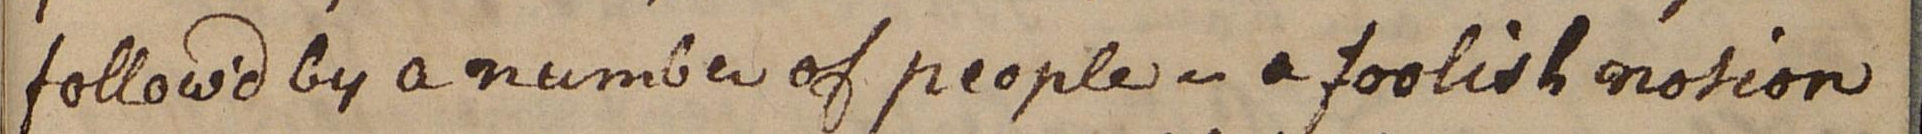follow'd by a number of people - a foolish notion
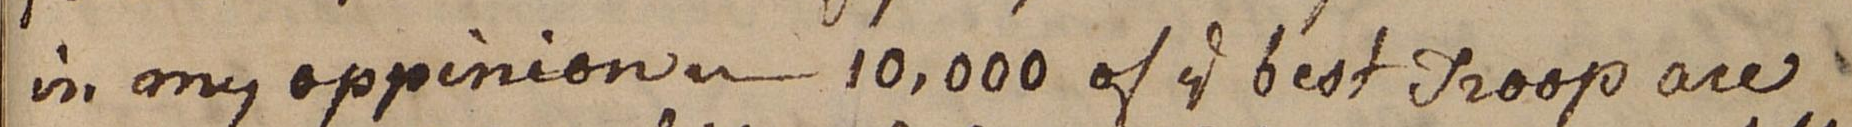in my appinienn 10,000 af yf best Troop are
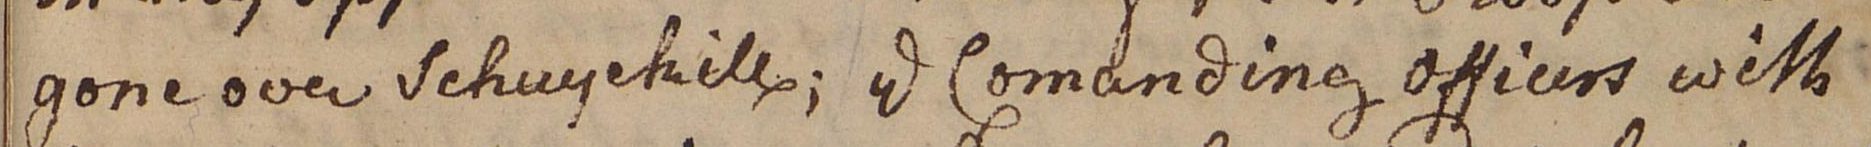gone over Schuyckill; y^e Comanding Officers with
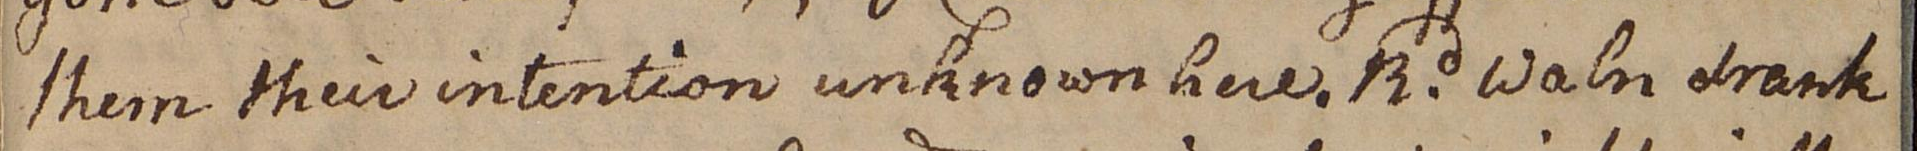them their intention unknown here. R^d. Waln drank
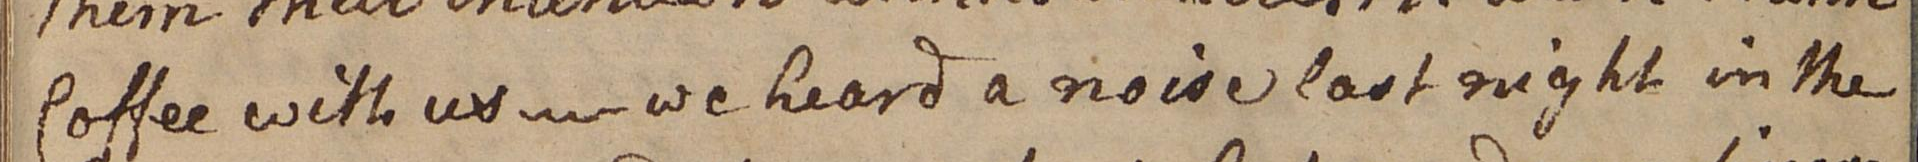Coffee with us- we heard a noise last night in the
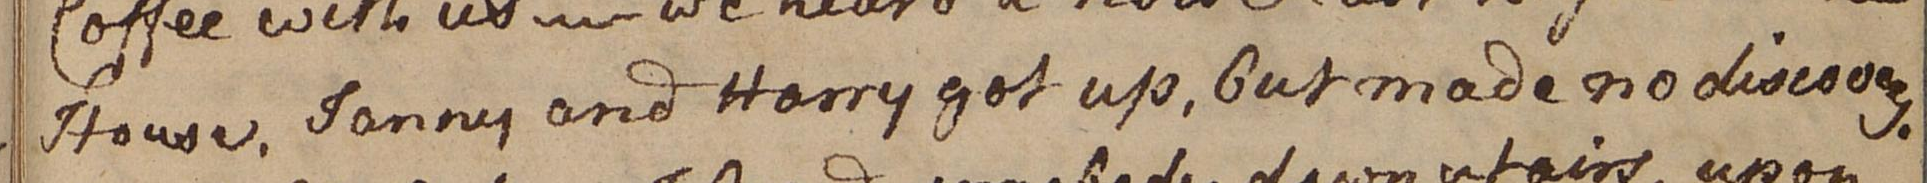House, Sanny and Harry got up, but made no discovery.
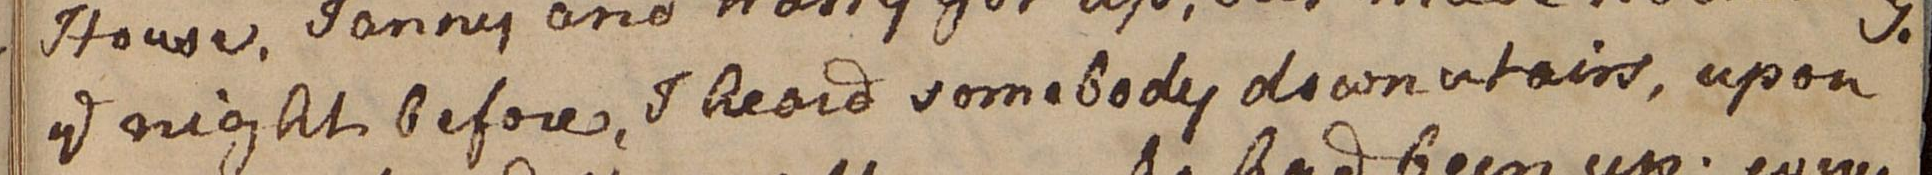y^e night before, I heard some body downstairs, upon
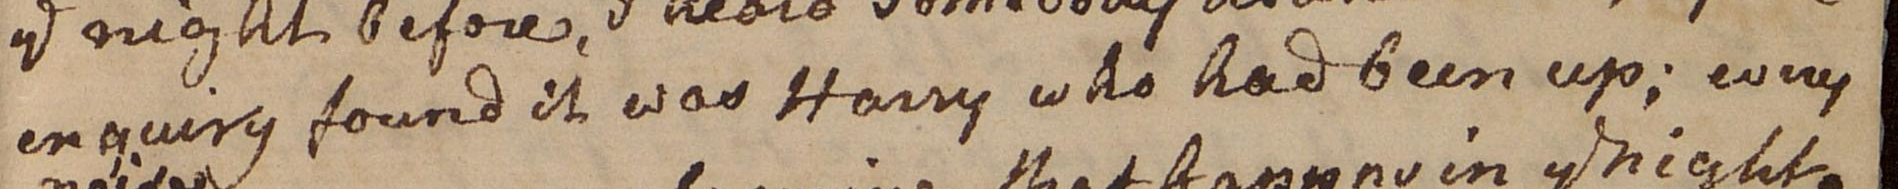enquiry found it was Harry who had been up; every
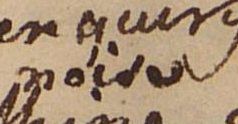noise
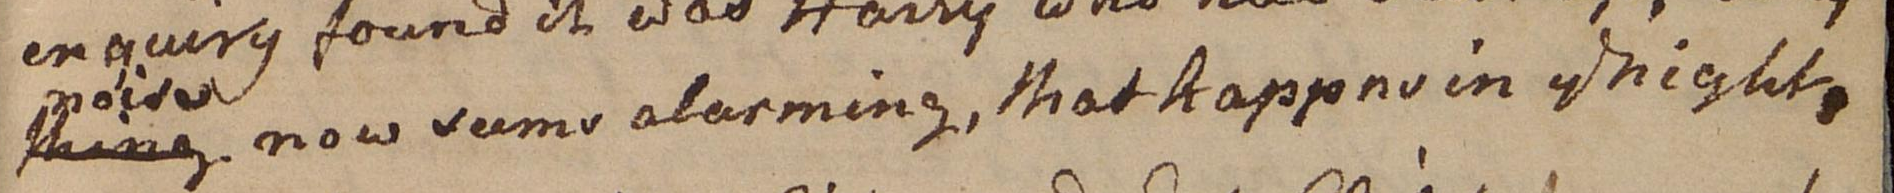[thing] now seems alarming, that happns in y^e night.
